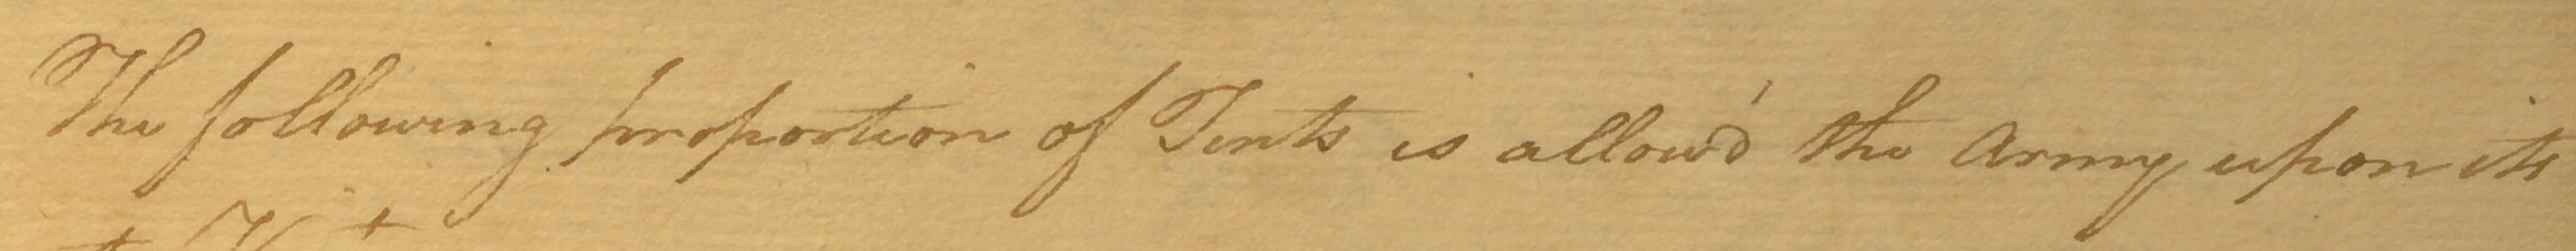The following proportion of Tents is allow'd the army upon its
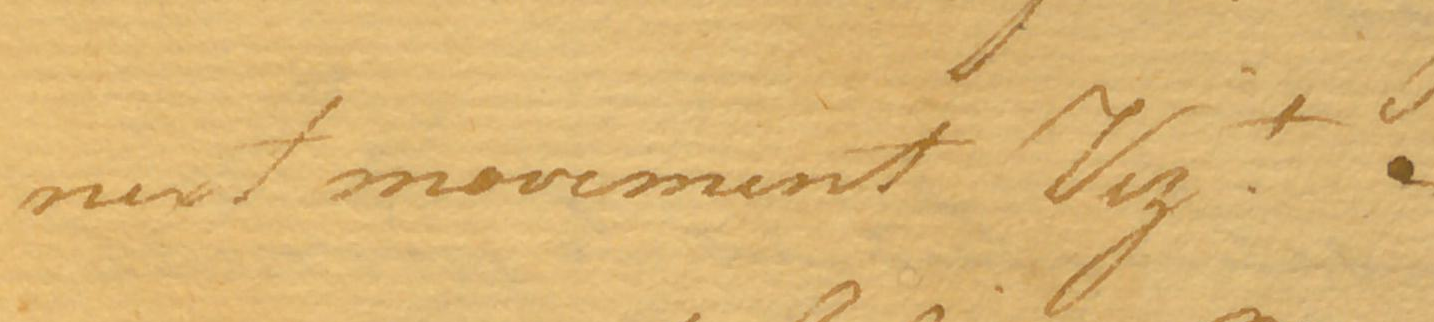next movement Viz^t.
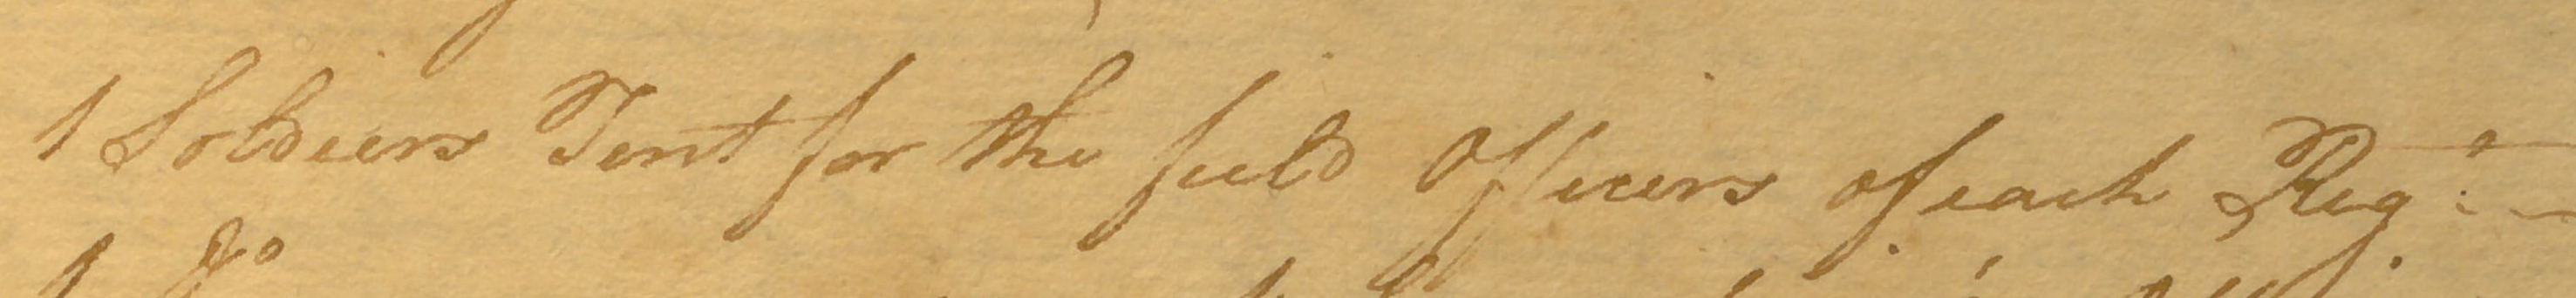1 Soldiers Tent for the field Officers of each Reg^t.
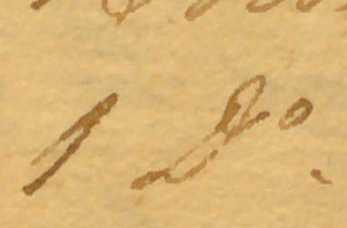1 D^o
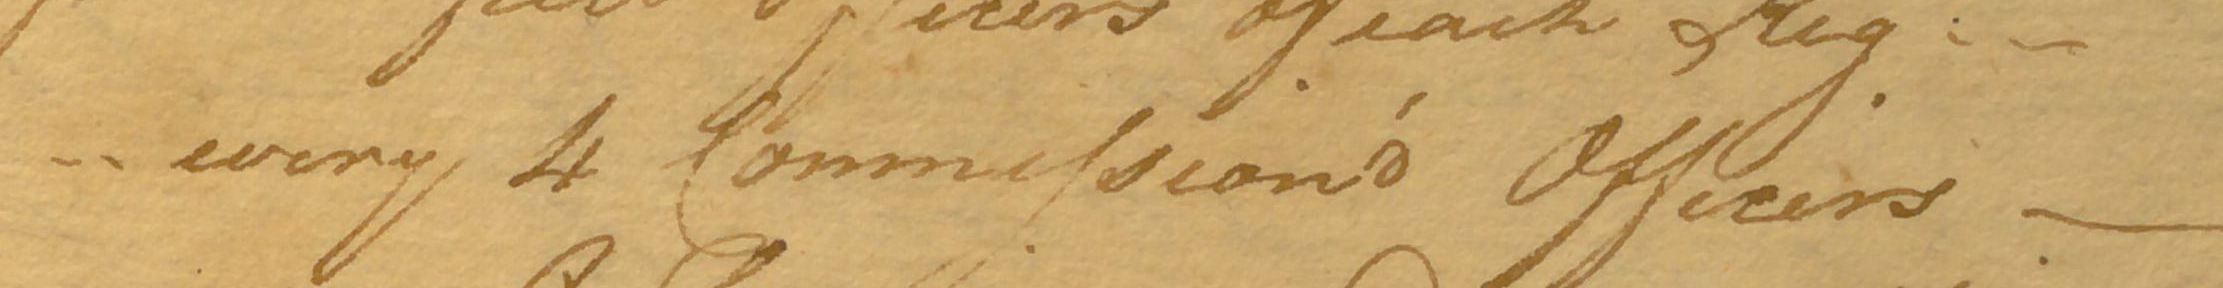.. every 4 Commission'd Officers-
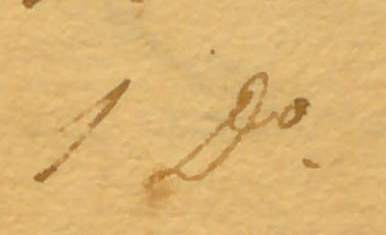1 D^o.
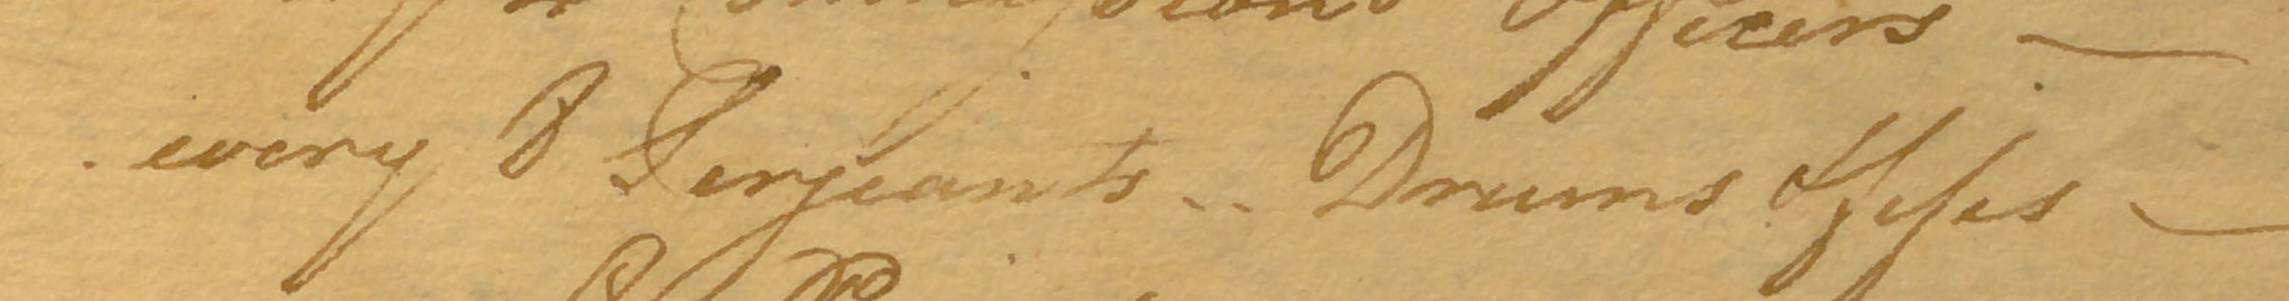. every 8 Serjeants.. Drums & fifes-
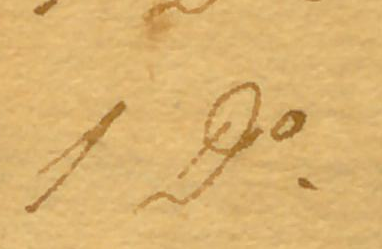1 D^o.
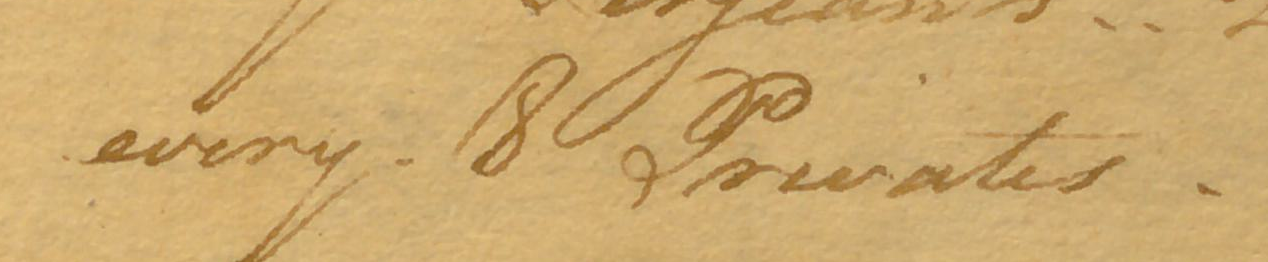every 8 Privates.
